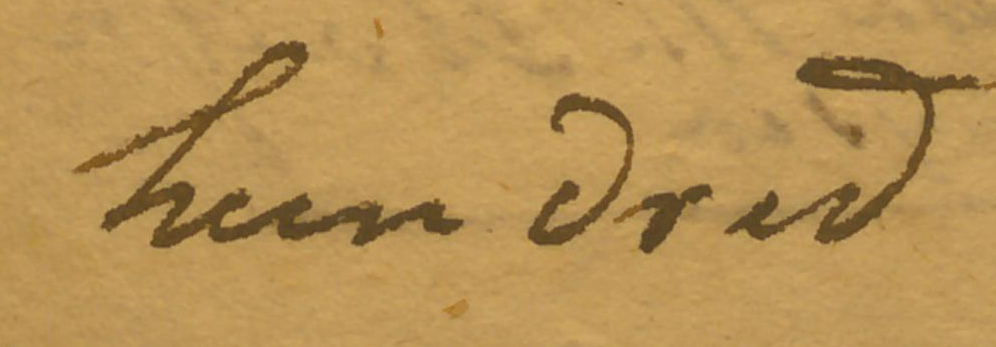been drid
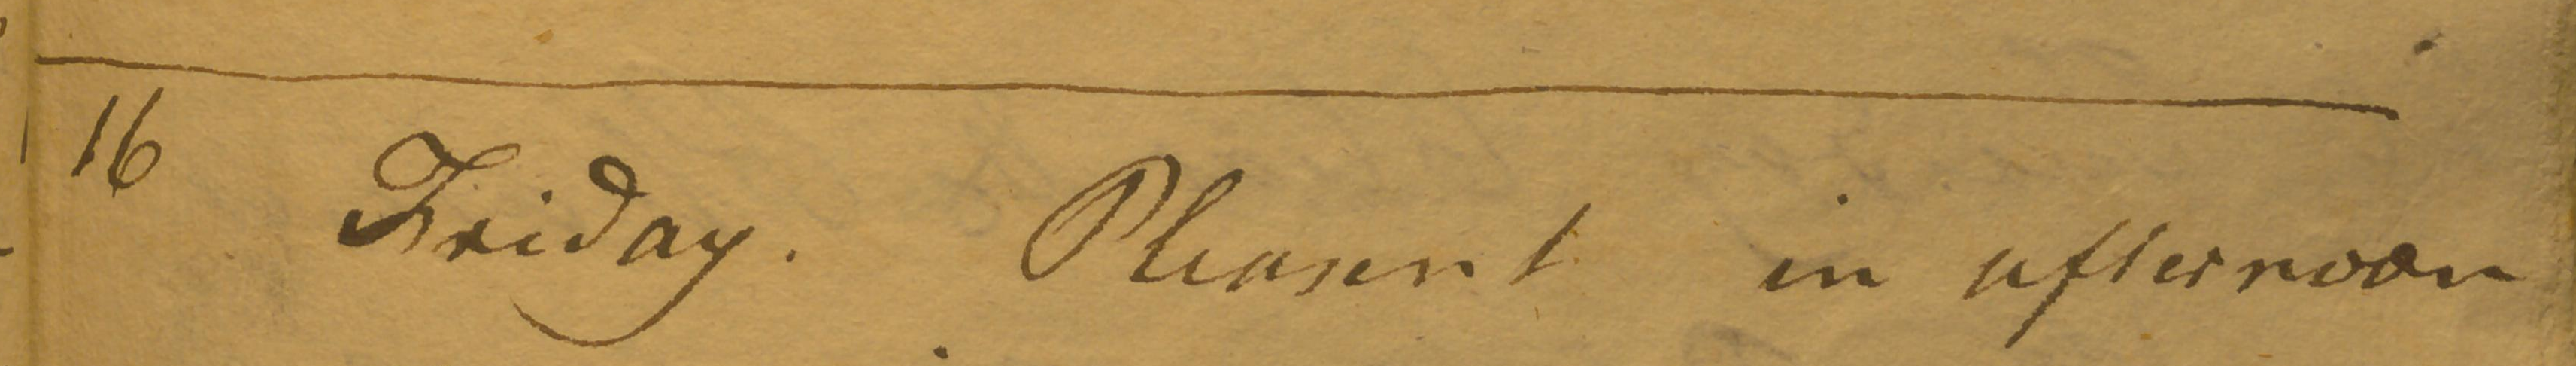16 Friday. Pleasent in afternoon
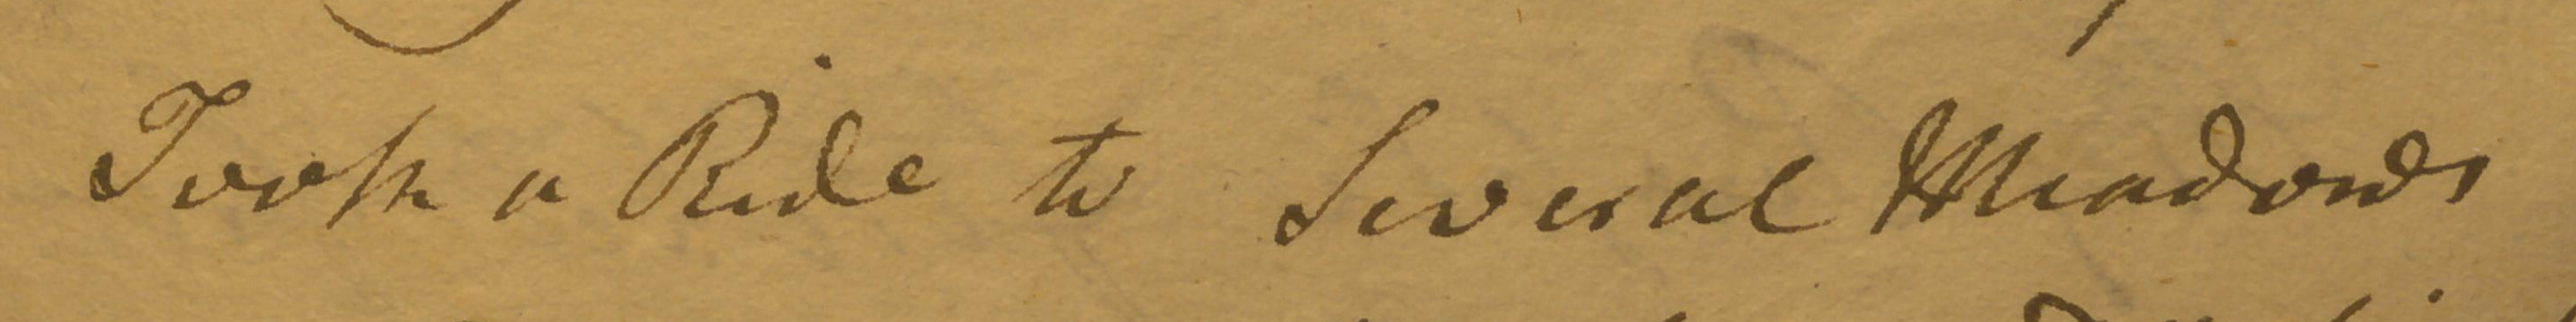Took a Ride to Several Meadows
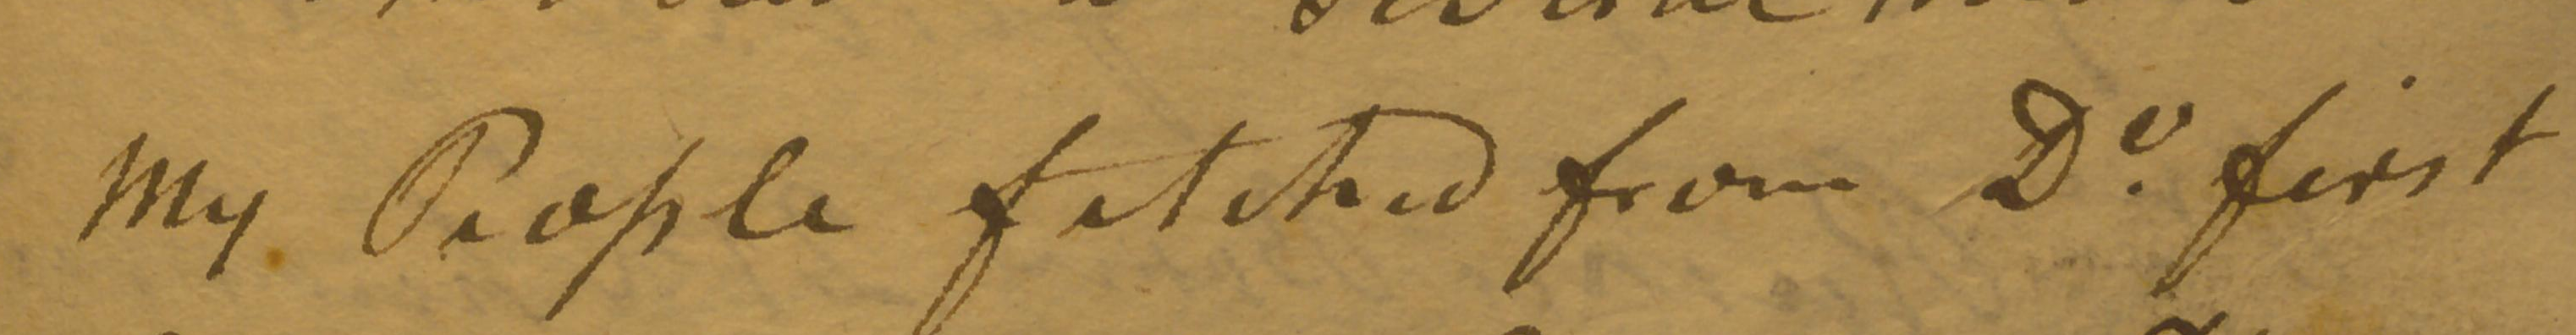My People fetched from D^o. first
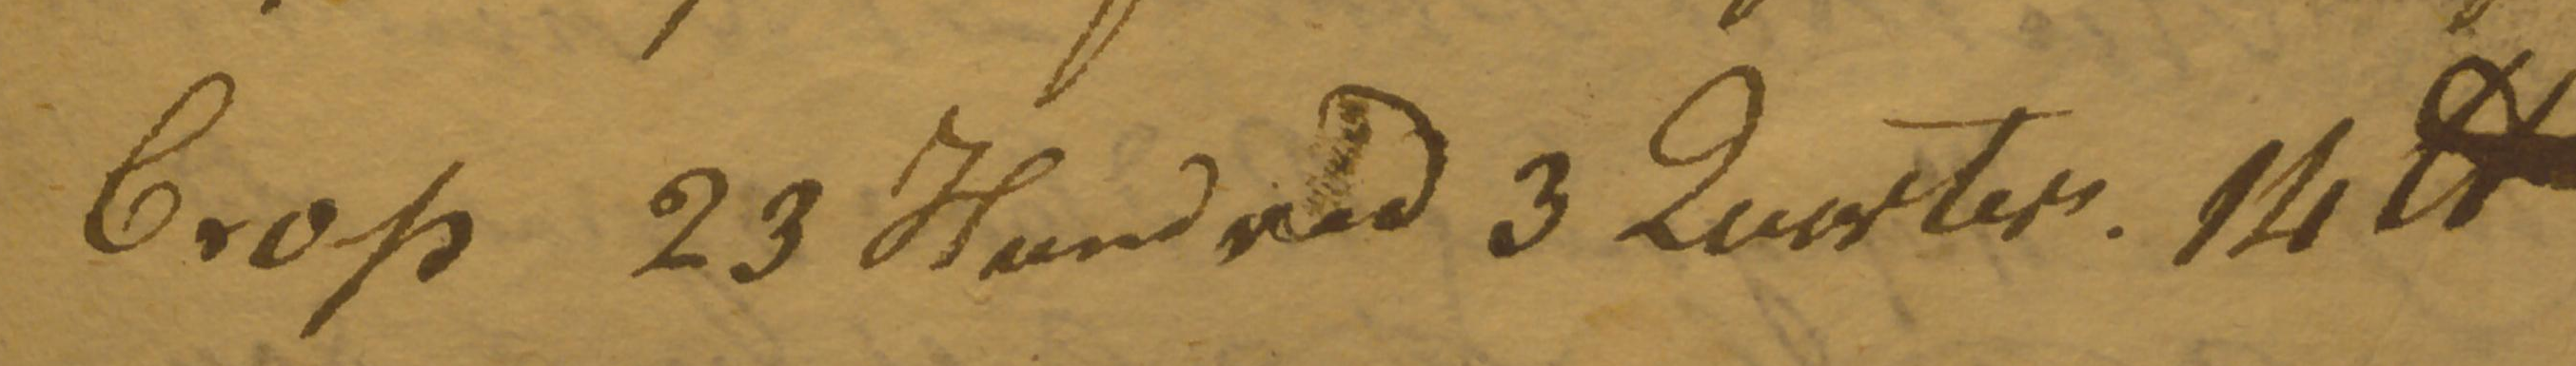Crop 23 Hundred 3 Quarters. 14 lb
